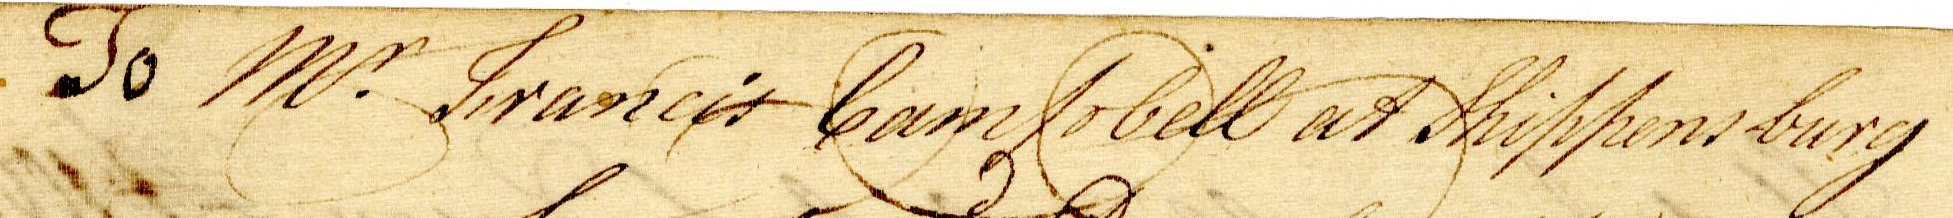To M^r. Francis Campbell at Shippensburg
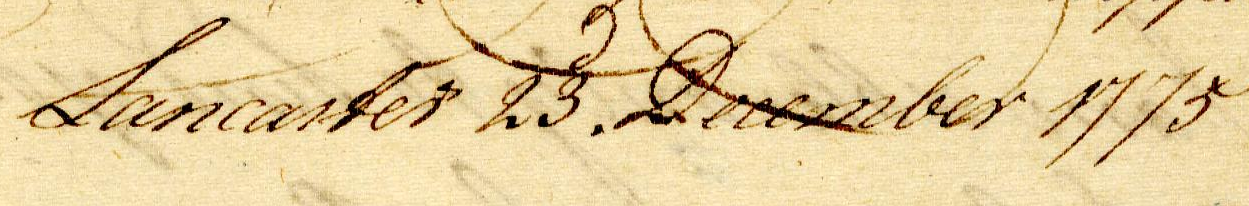Lancaster 23^d. December 1775
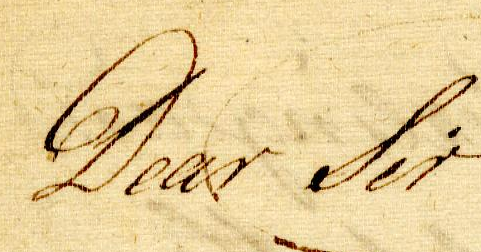Dear Sir
